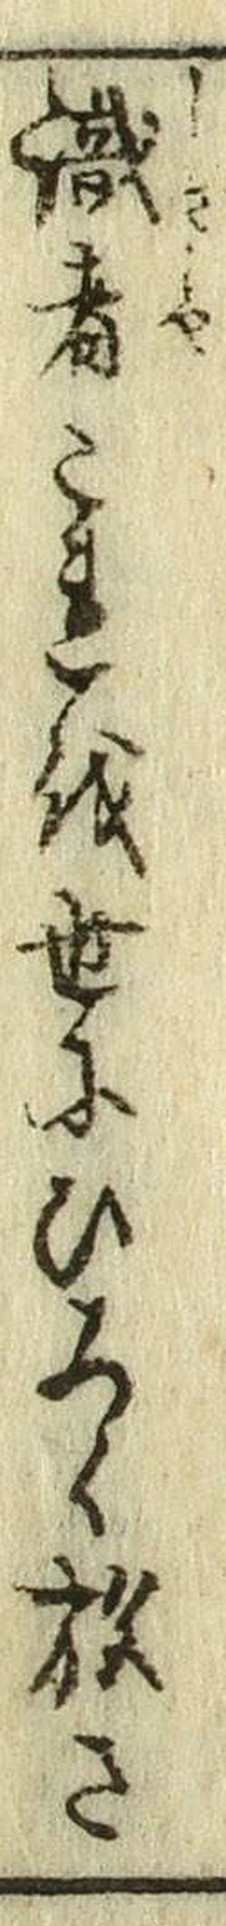識者これを世にひろく施さ
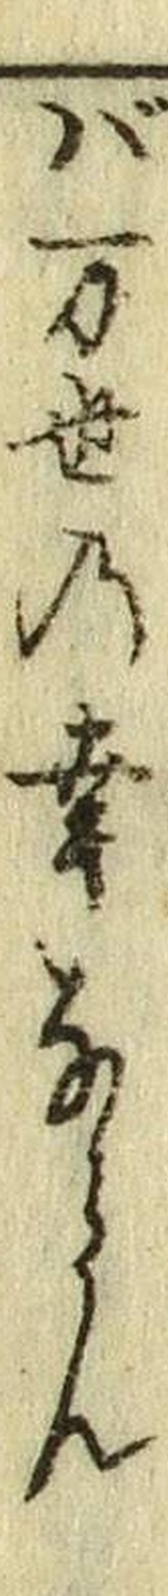ば万世の幸ならん

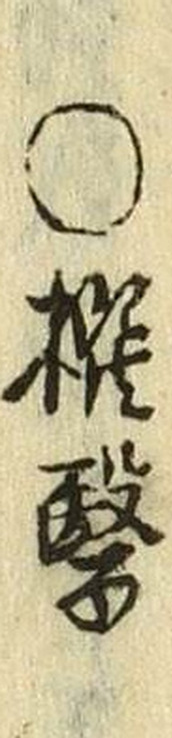○撰医
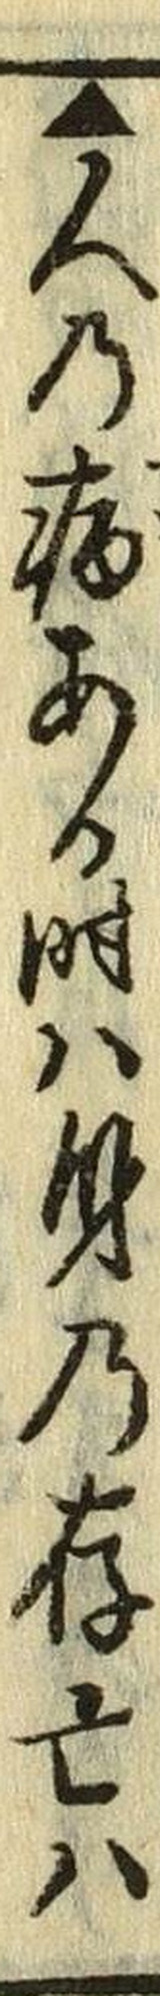▲人の病ある時は身の存亡は
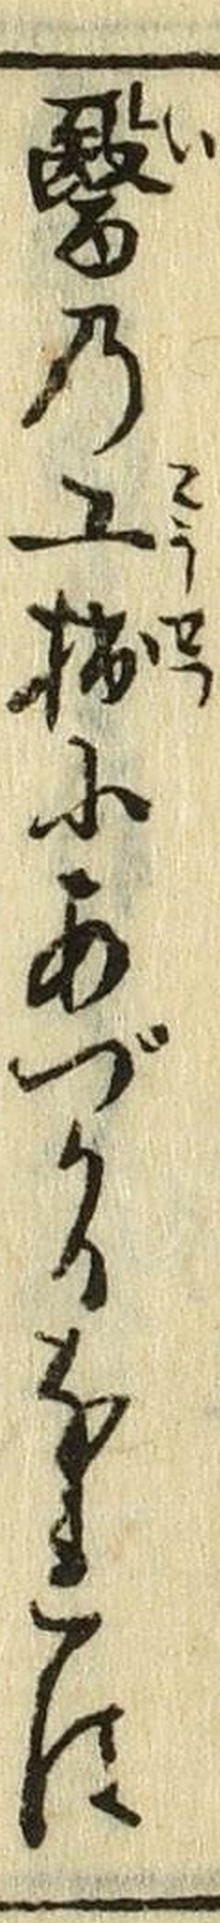医の工拙にあづかるなれは
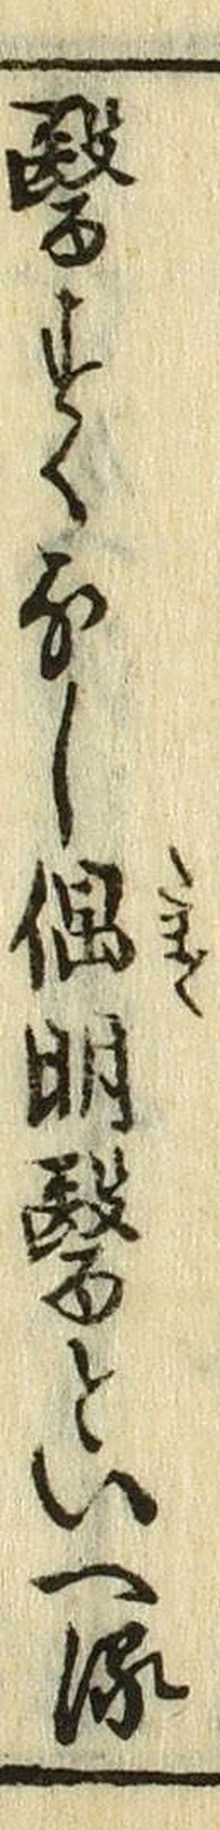医すくなし偶明医といへる
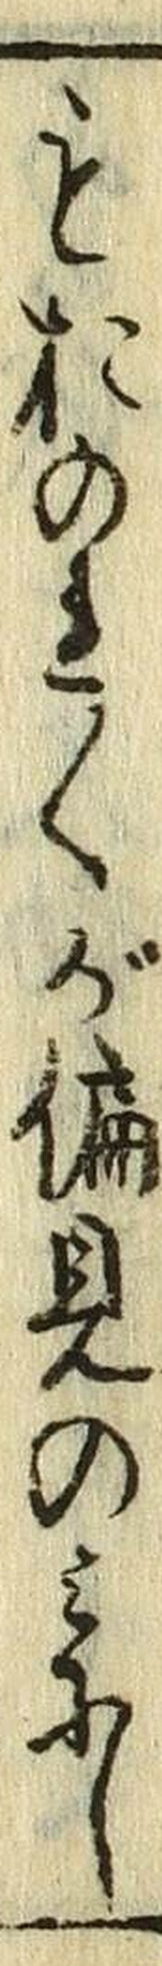もおのれ〳〵が偏見のみにし
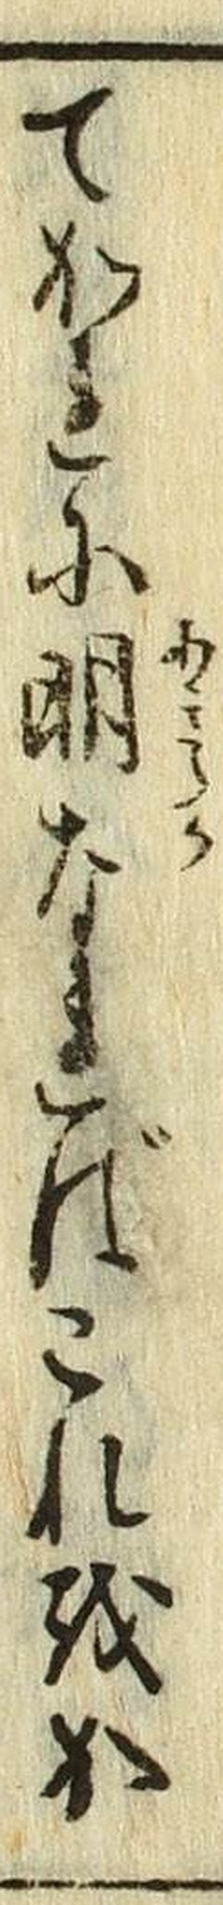てかれに明なればこれをか
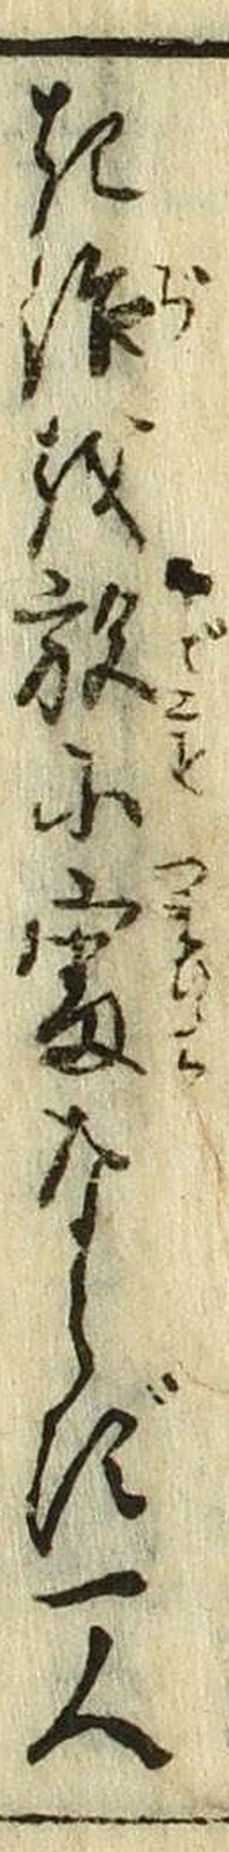き治を施に審ならず一人
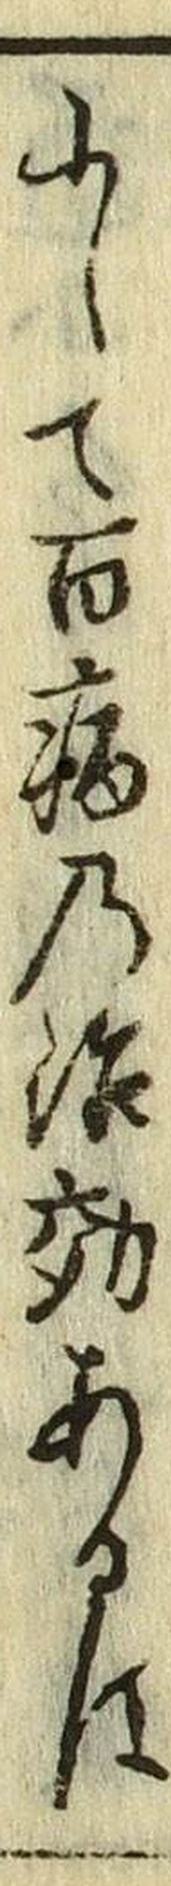にして百病の治効あるは
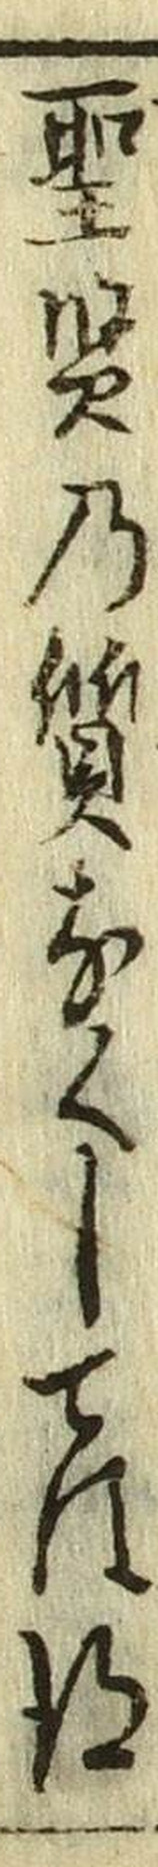聖賢の質なくしては得
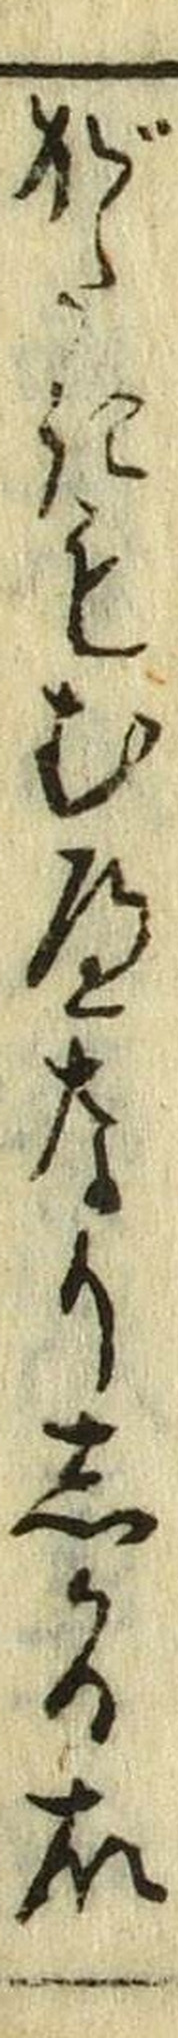がたきもむへなりしかる故

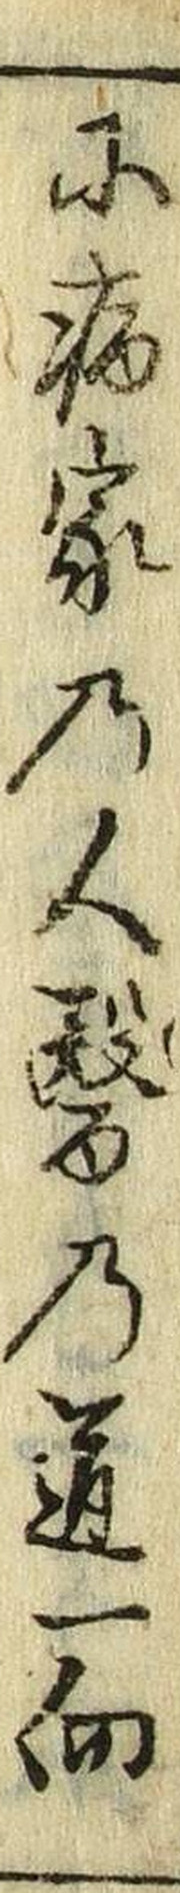に病家の人医の道一向
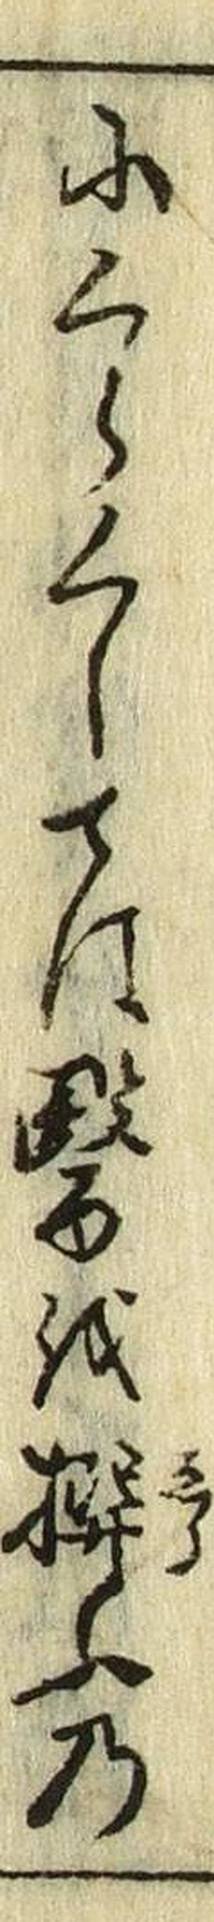にくらくしては医を撰ふの
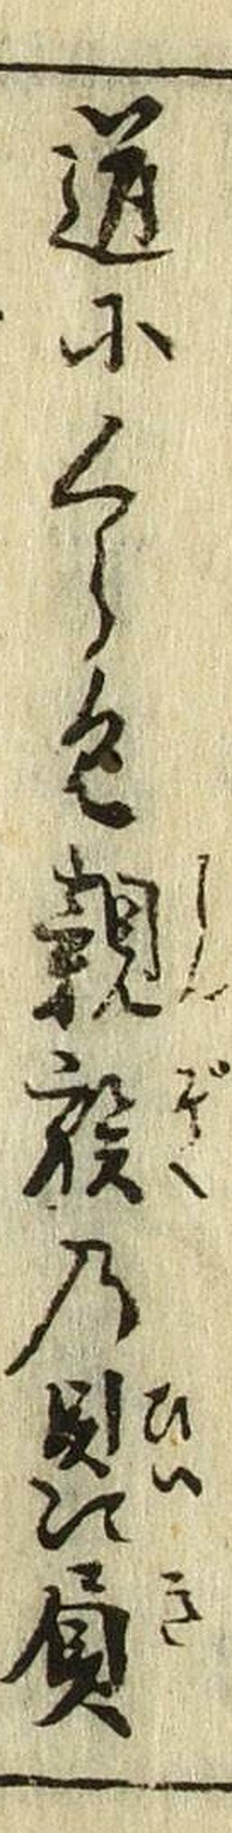道にくらく親族の贔屓
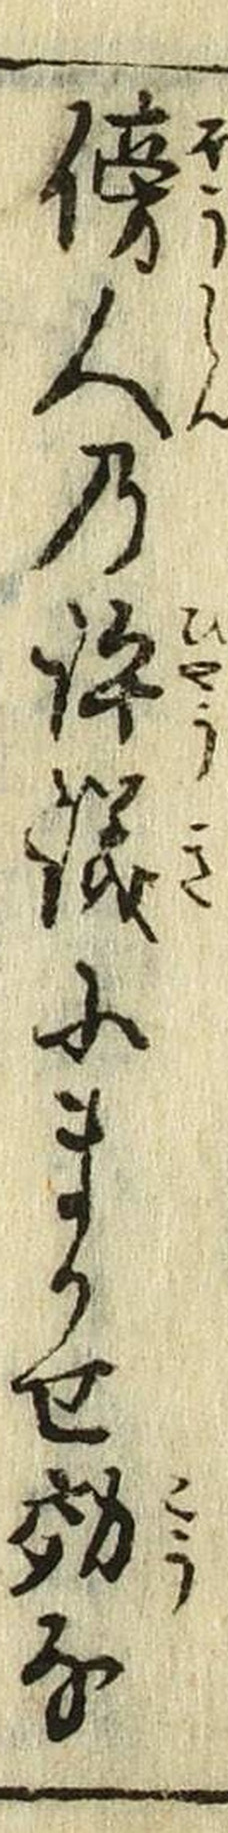傍人の評議にまかせ効な
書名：居家養生記
